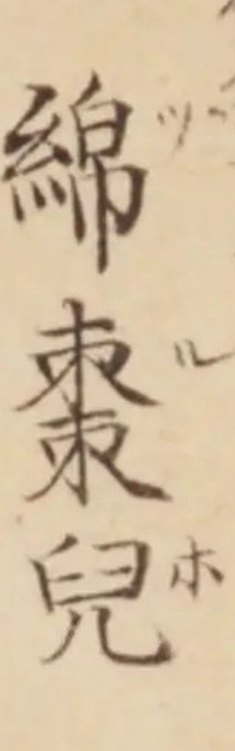綿棗児
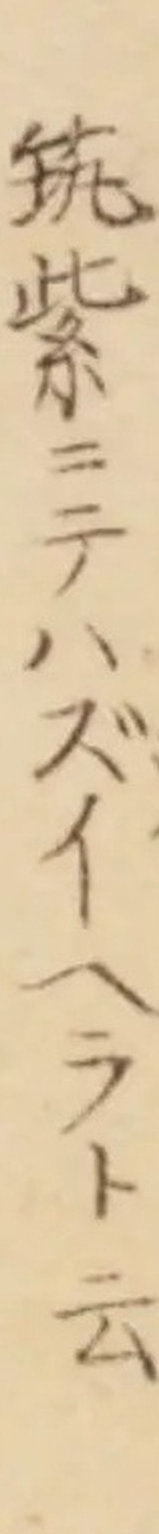筑紫ニテハズイヘラト云
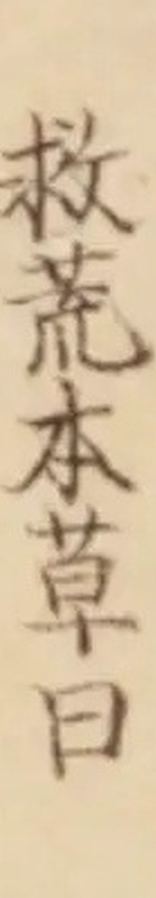救荒本草曰
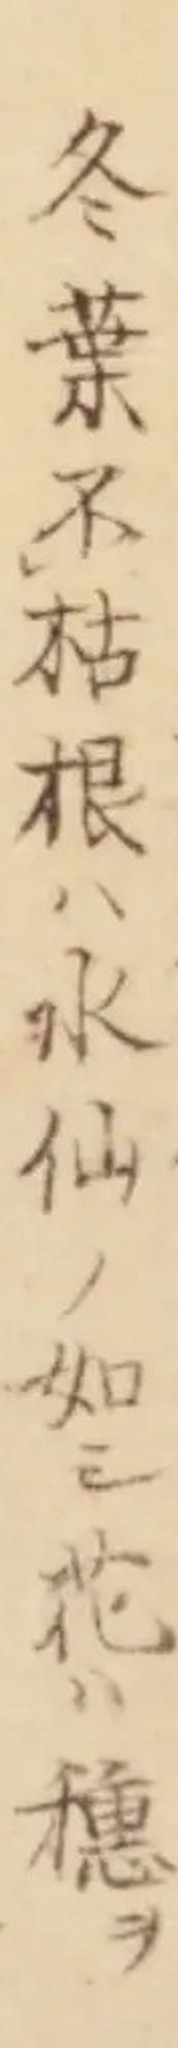冬葉不枯根ハ水仙ノ如シ花ハ穂
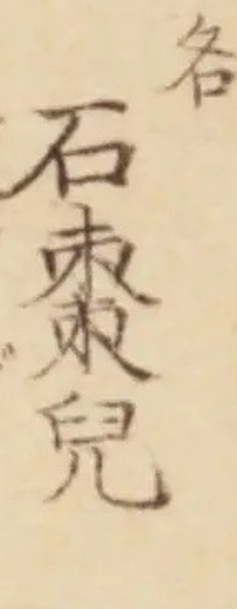石棗児
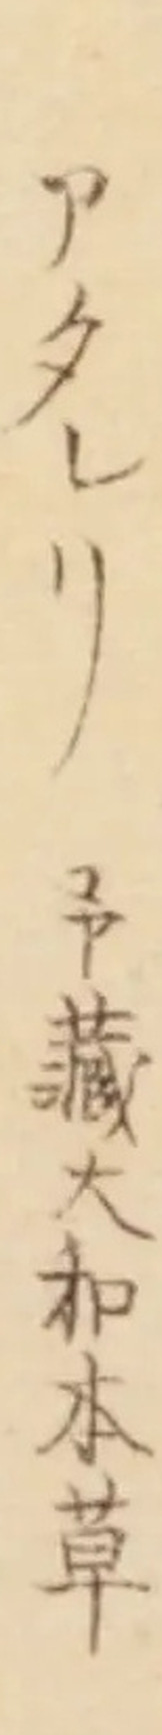アタレリ予蔵大和本草
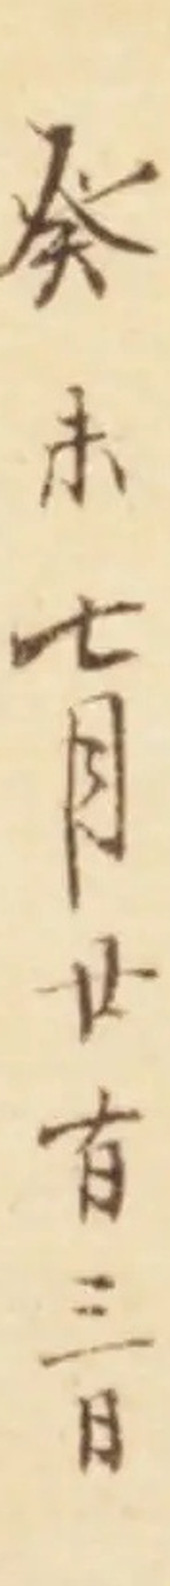癸未七月廿有一日
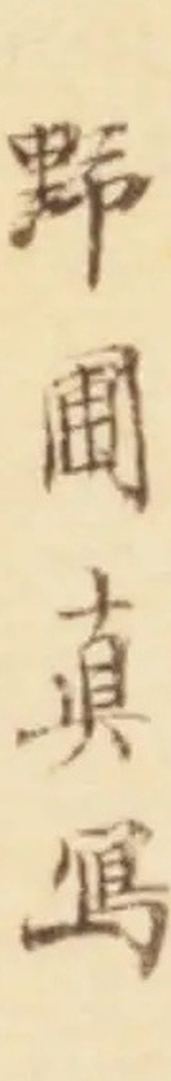野圃真写
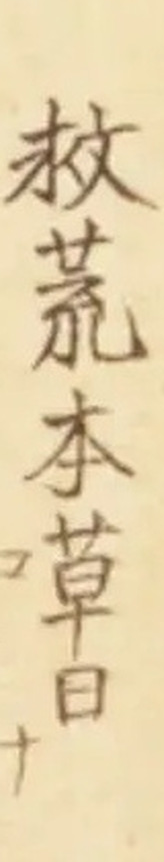救荒本草曰
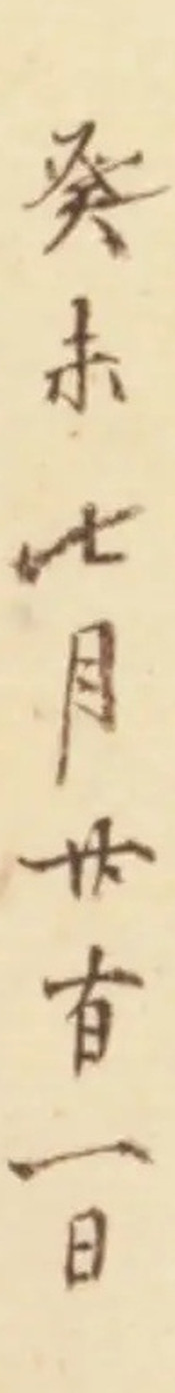癸未七月廿有一日
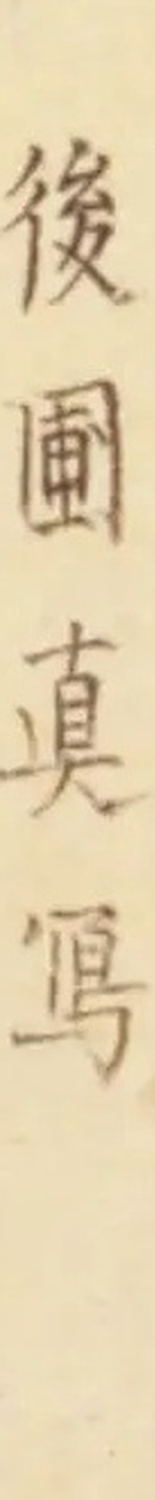後圃真写
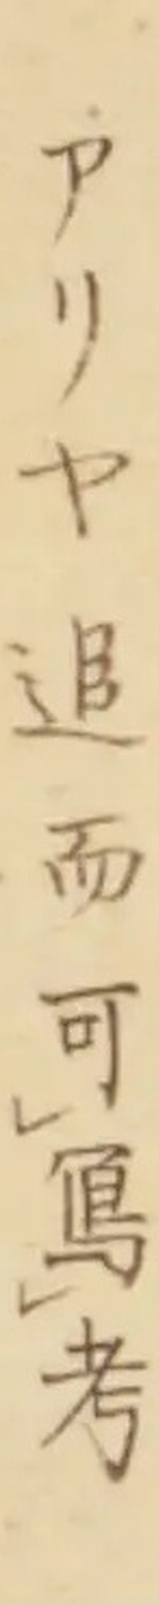アリヤ追而可写考

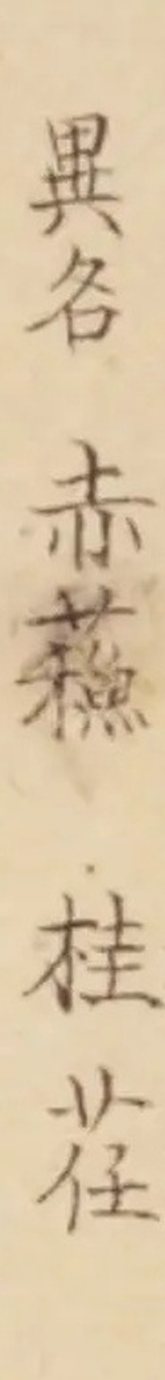紫蘇異名赤蘇桂荏
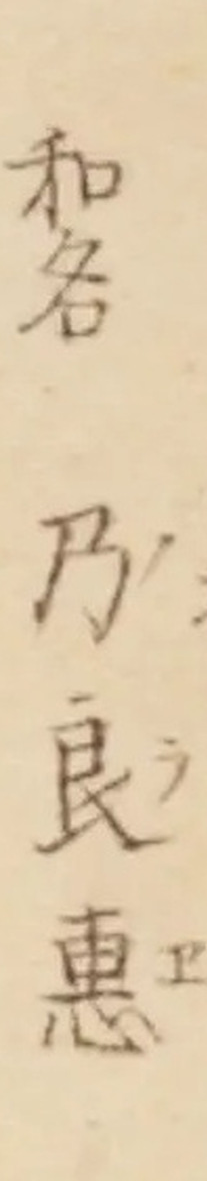和名乃良恵
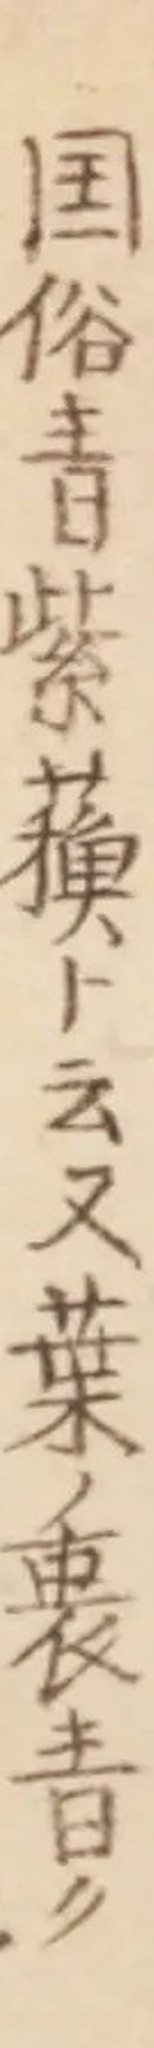国俗青紫蘇ト云又葉ノ裏青ク
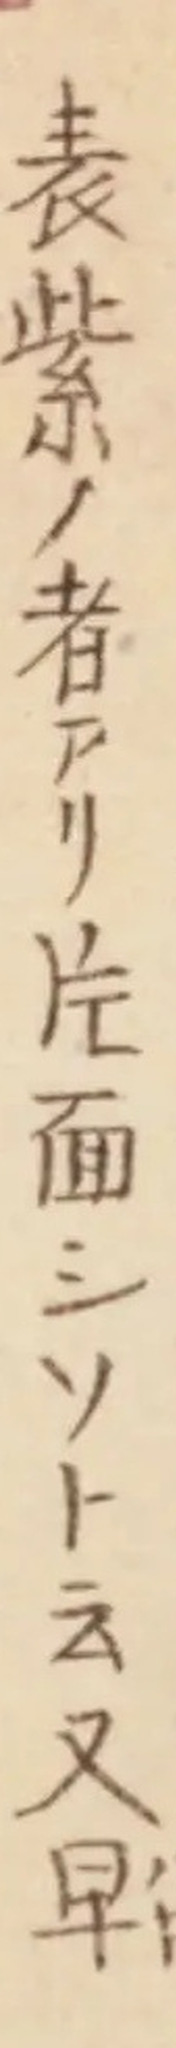表紫ノ者アリ片面シソト云又早
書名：梅園草木花譜秋之部. 2
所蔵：国立国会図書館 National Diet Library, JAPAN
